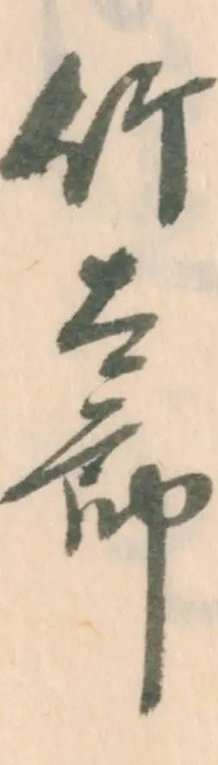竹太郎
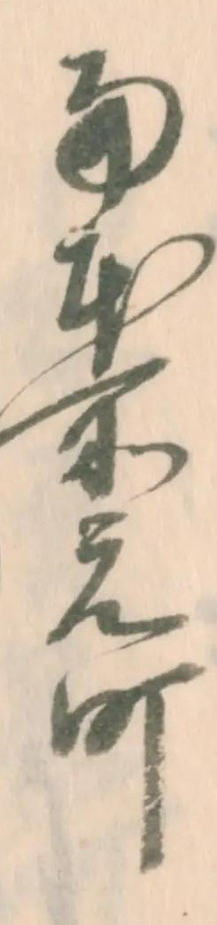南本所元町
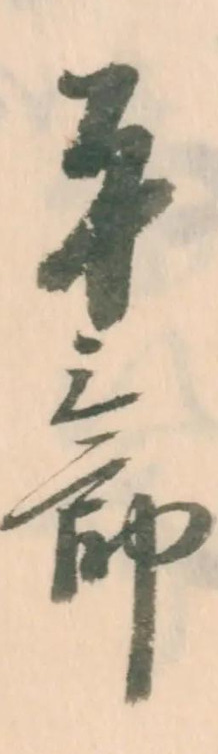平三郎
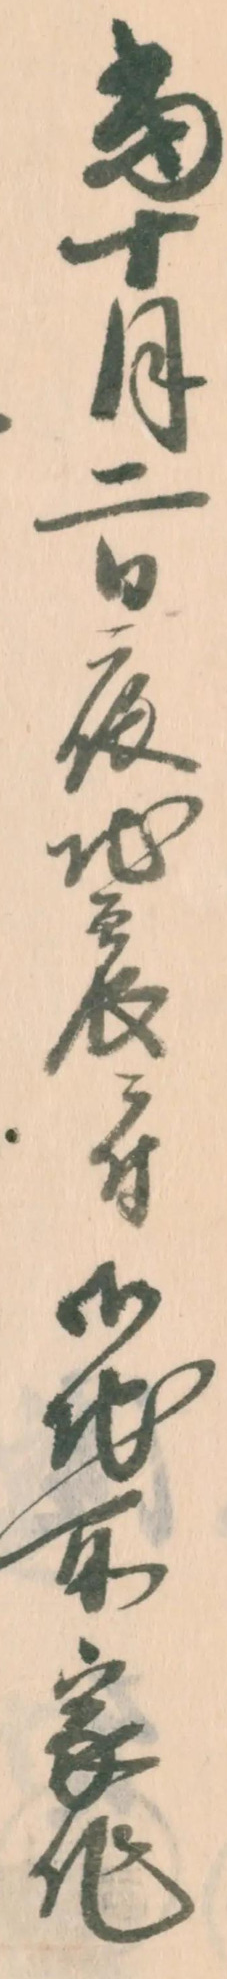当十月二日夜地震ニ付御地所家作
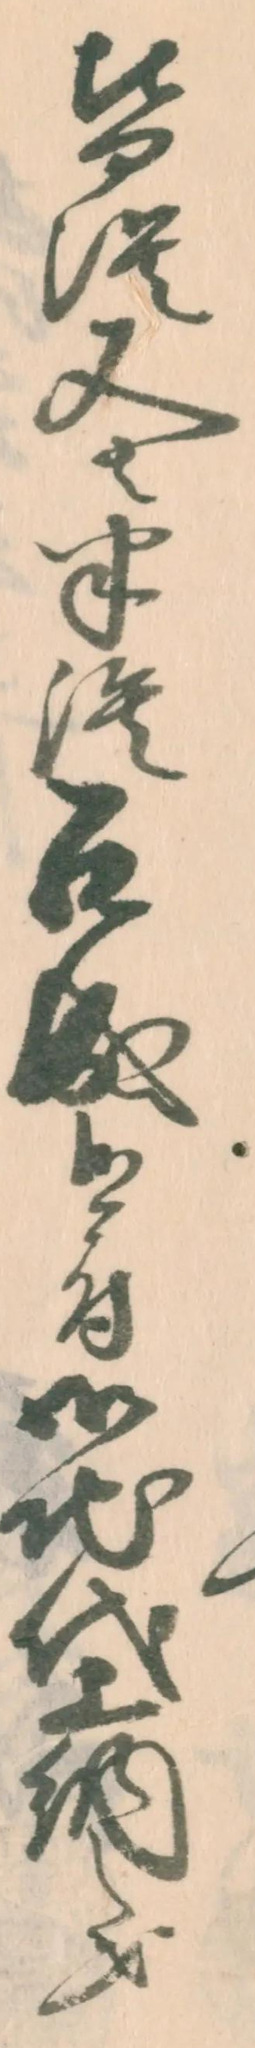皆潰又は半潰罷成候ニ付御地代上納之義
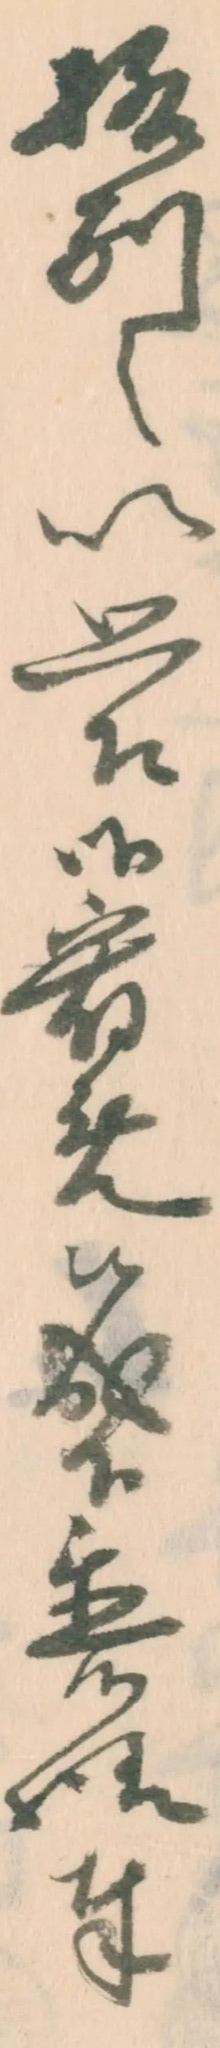格別之以思召御宥免被成下置候様奉
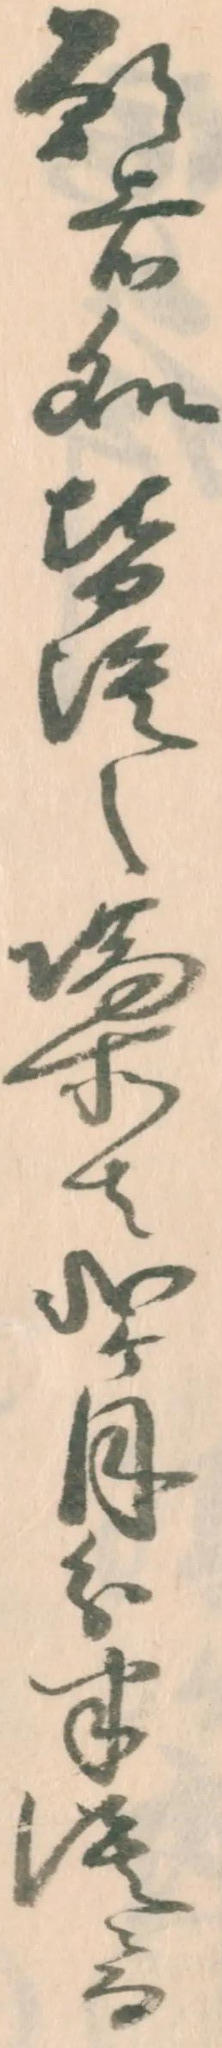願上候処皆潰之場所は弐ヶ月分半潰ニ而
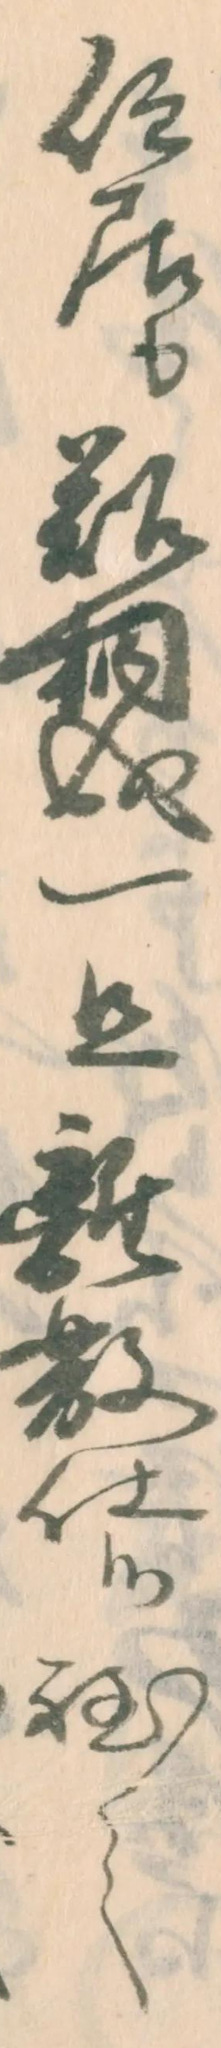住居も難相成一旦離散仕候程之
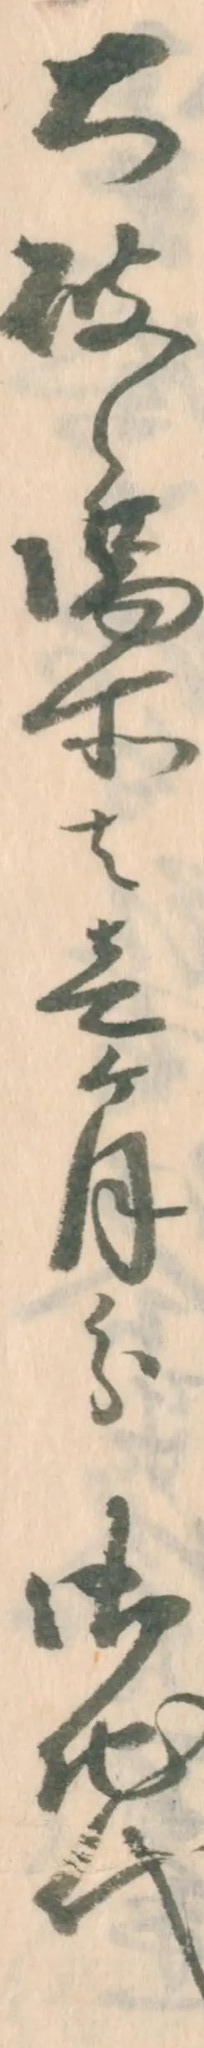大破候場所は壱ヶ月分御地代

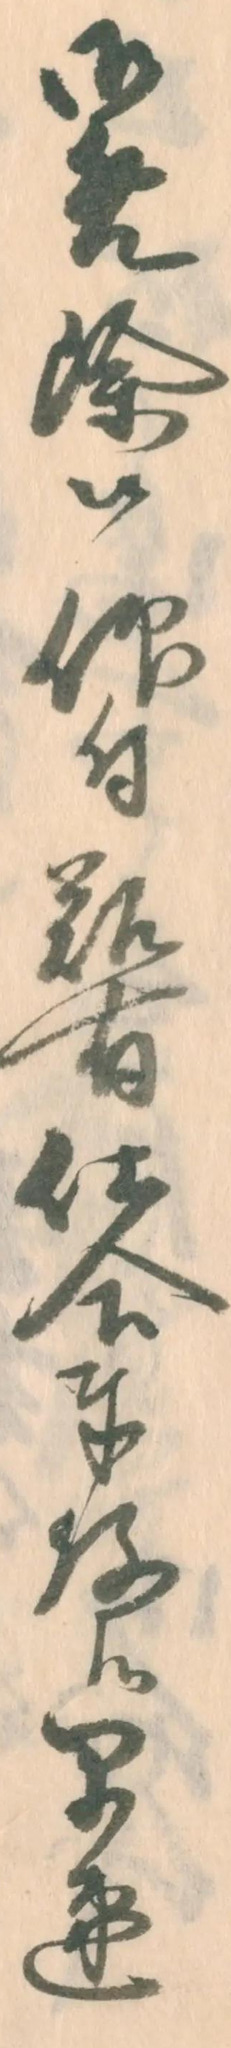御免除被仰付難有仕合奉存候早速
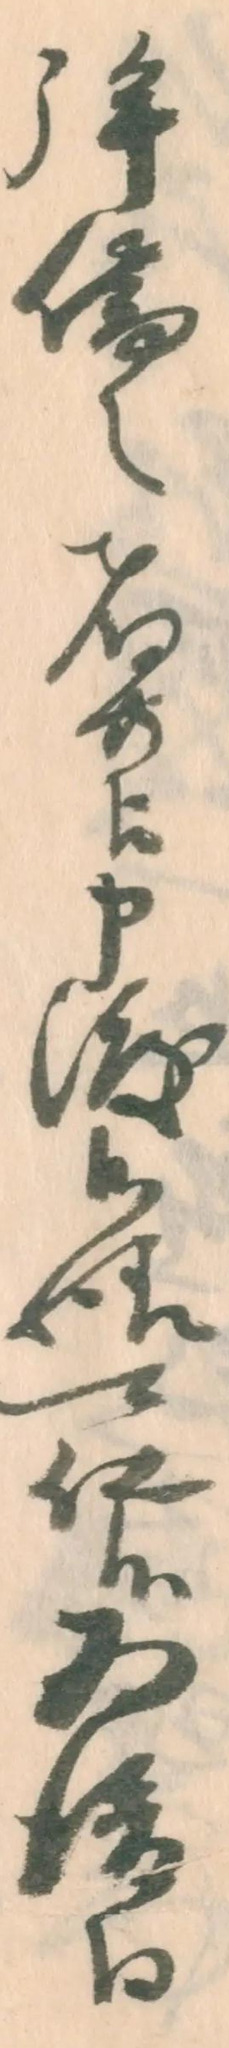拝借之者共え申渡候様可仕候為後日
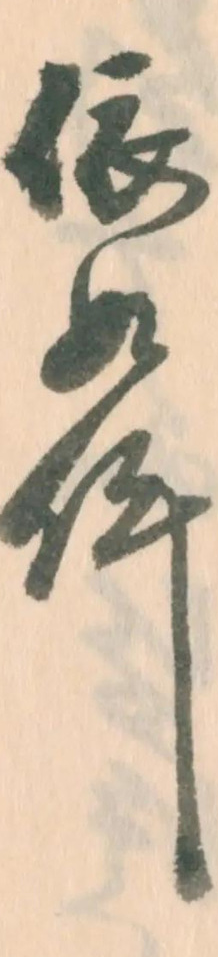依如件
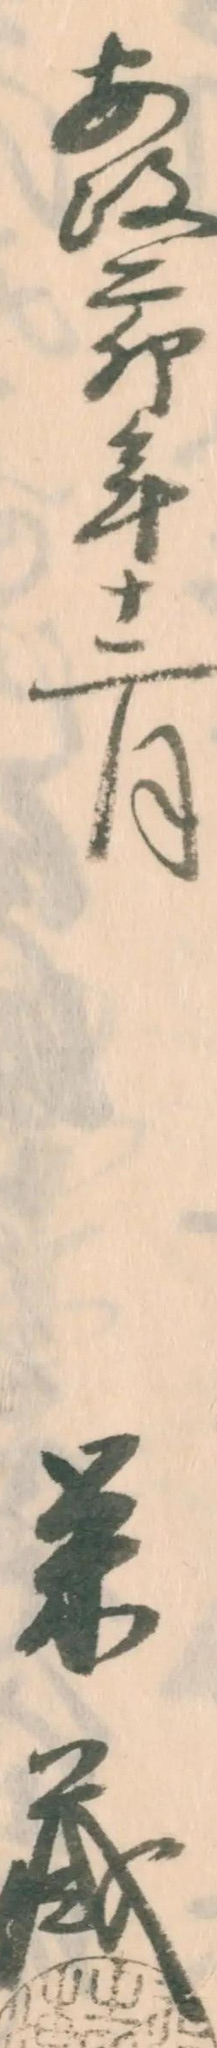安政二卯年十二月栄蔵(印)
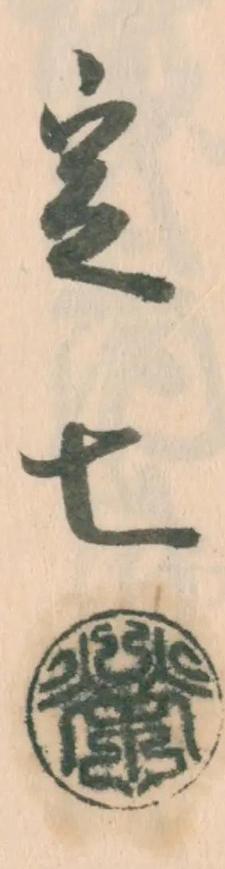定七(印)
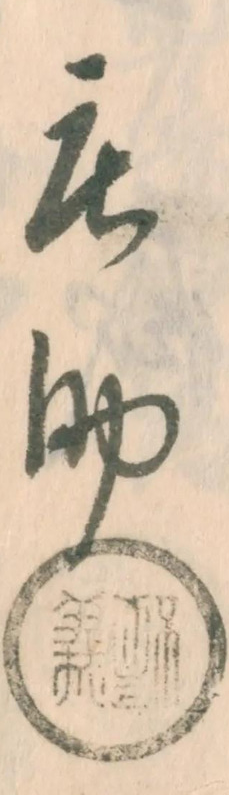庄助(印)

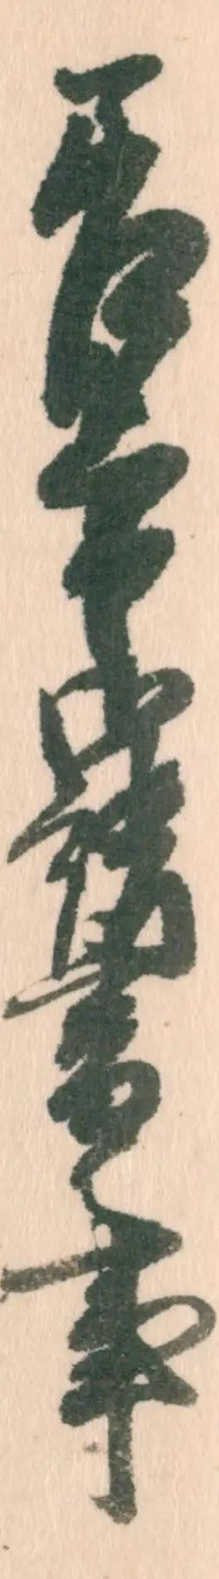差上申御請書之事
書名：地震災書留 2巻. [1] 内表紙に「地震災書留　安政二卯年　但本所深川御用屋敷地代免除調」とあり
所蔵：国立国会図書館 National Diet Library, JAPAN
